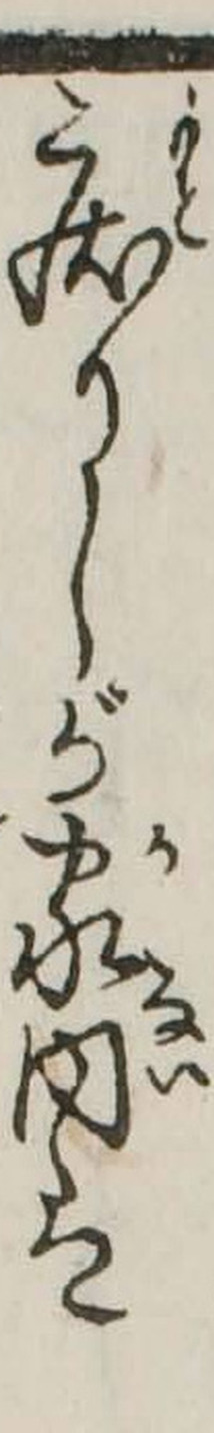戻りしが家内は
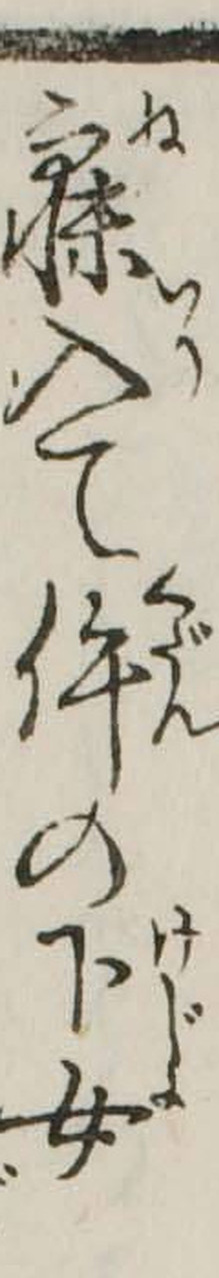寝入て件の下女
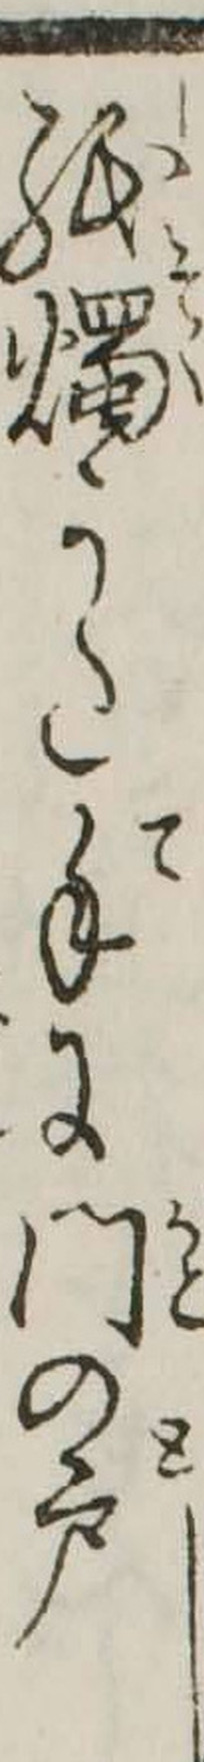紙燭かた手に門の戸
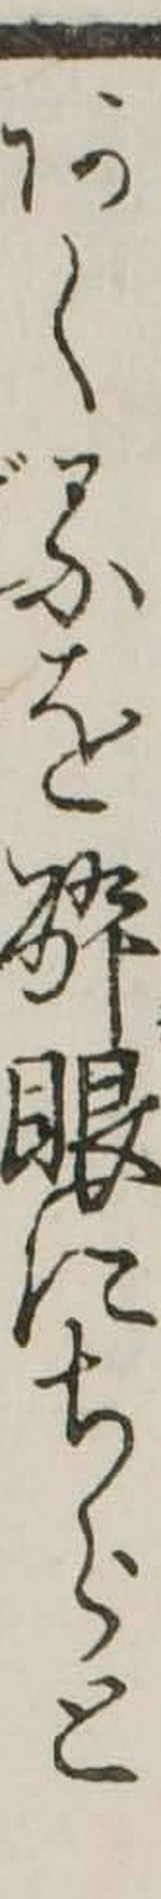あくるを酔眼にちらと
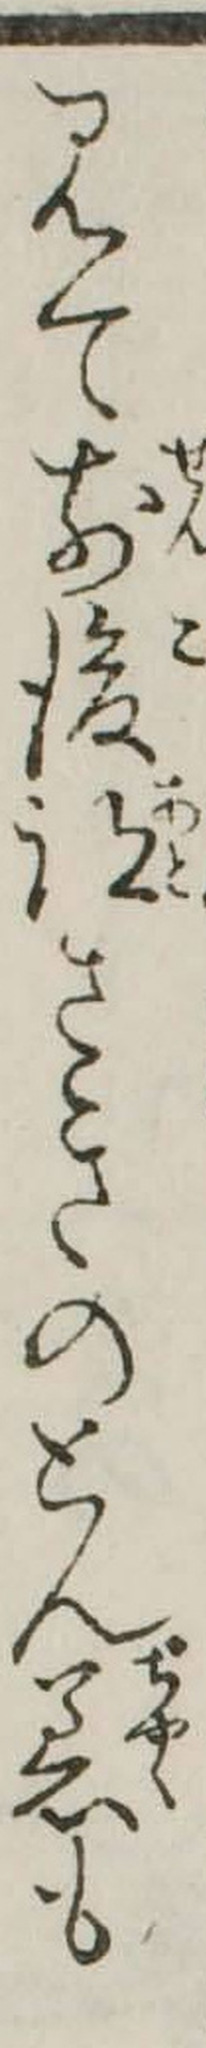見て前後跡さきのとん着も
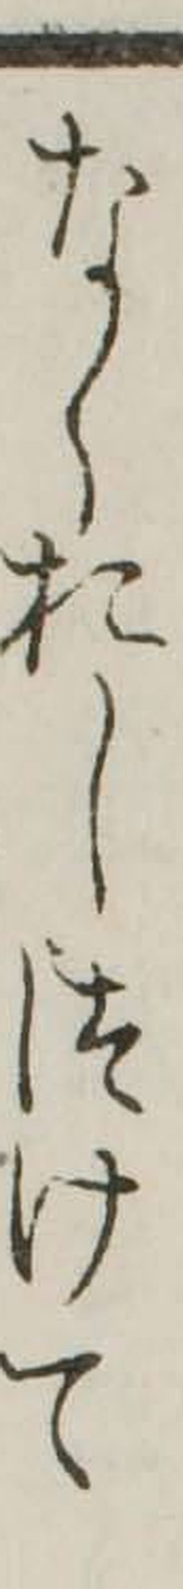なくおしつけて
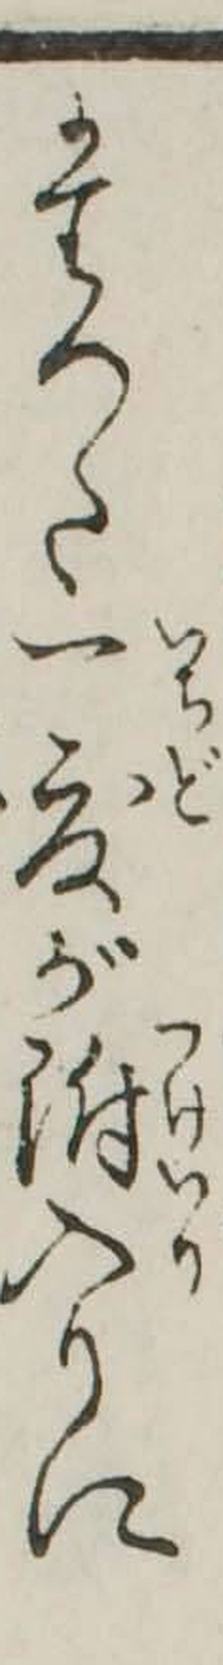たつた一度が附入りに
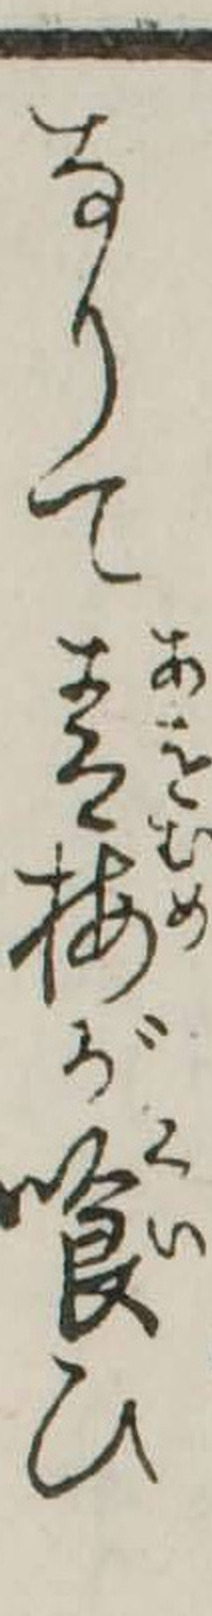なりて青梅が喰ひ
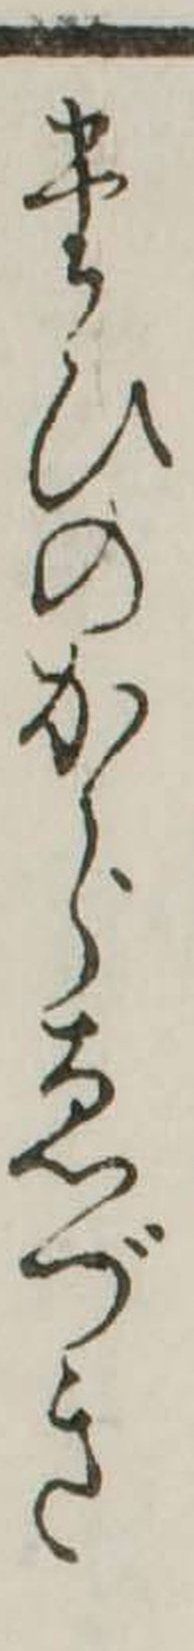たひのからゑづき
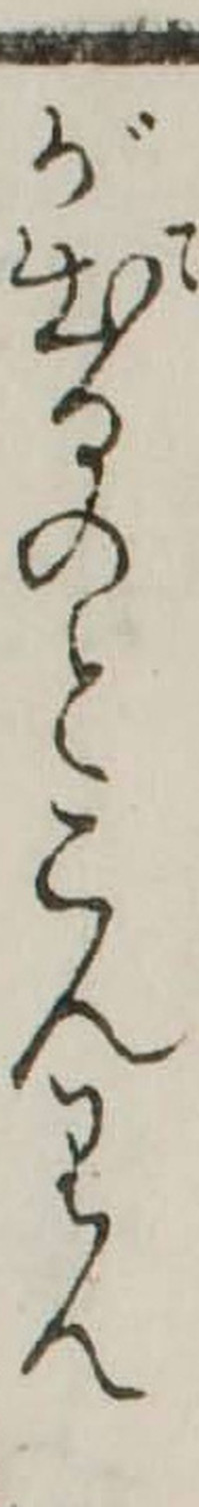が出るのとこんりん
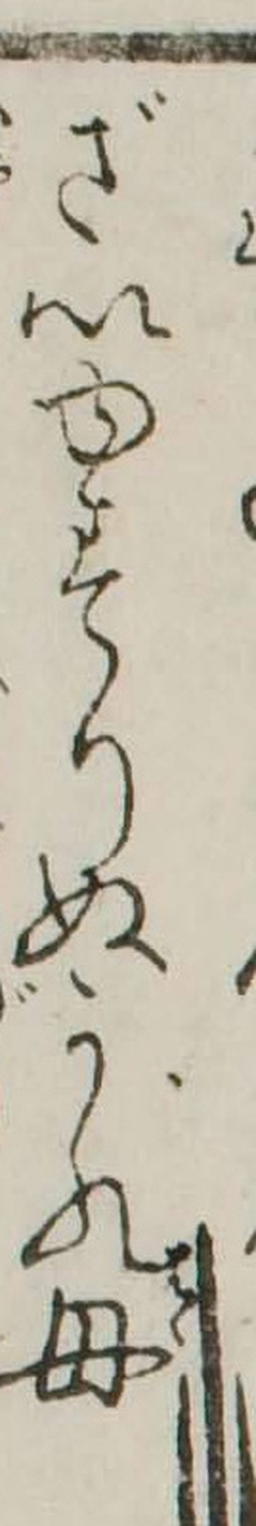ざいゆすりぬかれ母
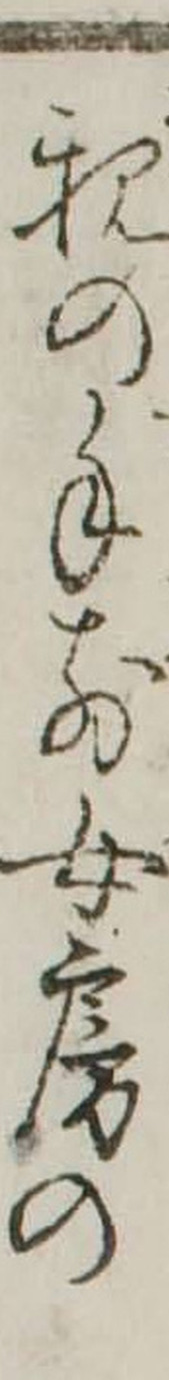親の手前女房の
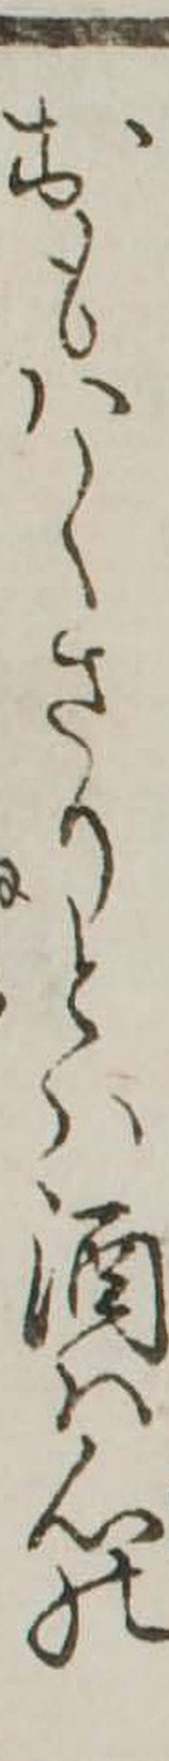おもはくさりとは酒は心の
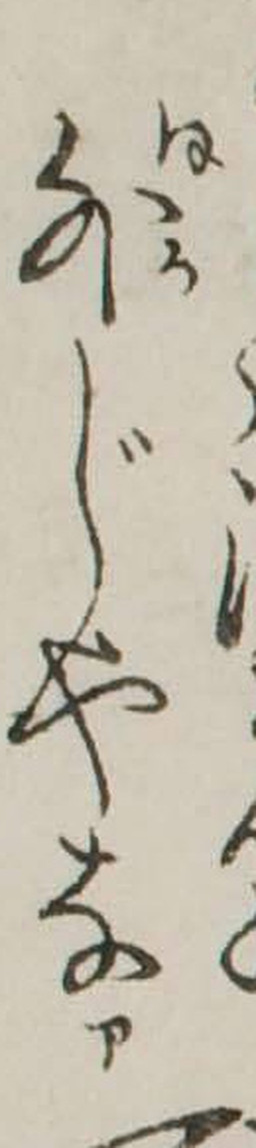外じやなァ

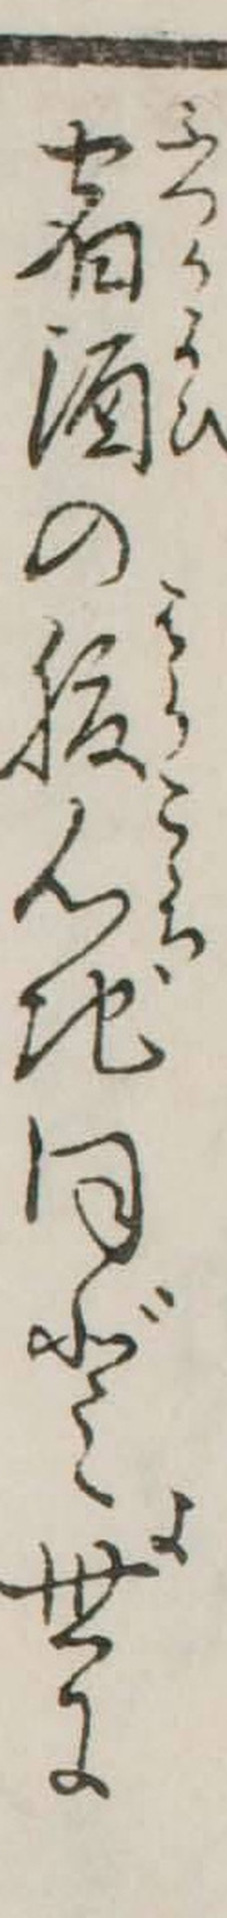宿酒の腹心地ほど世に
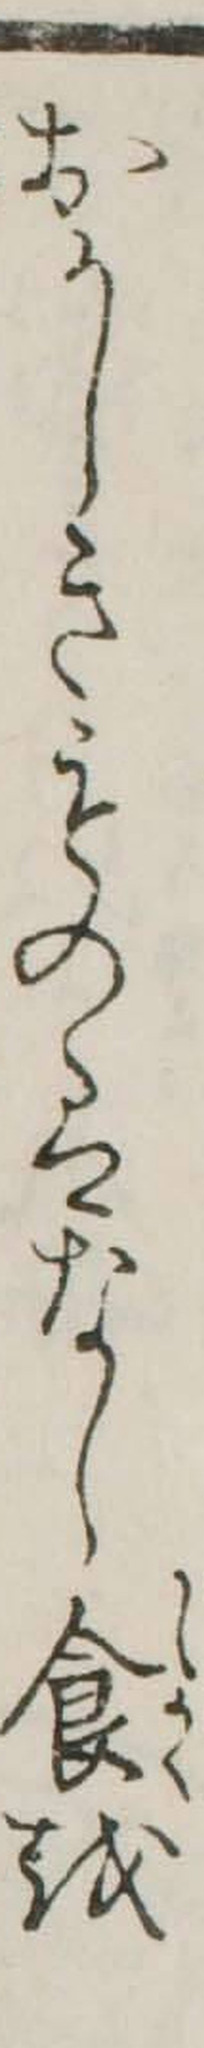おかしきものはなし食を
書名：繪本不盡泉
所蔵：国文学研究資料館
